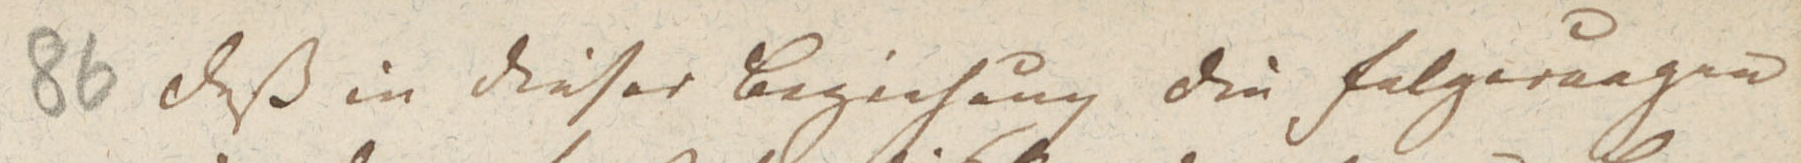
dass in dieser Beziehung die Folgerungen
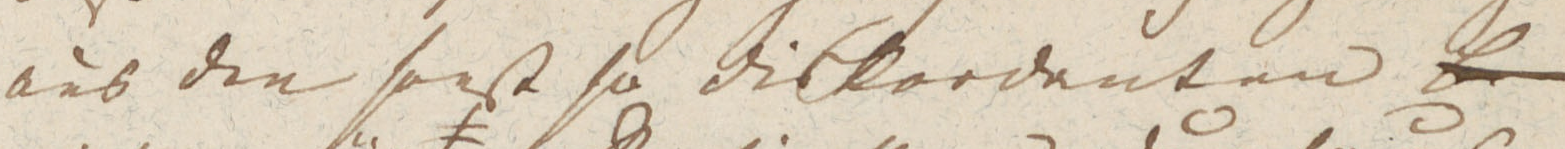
aus den sonst so diskordanten Be-
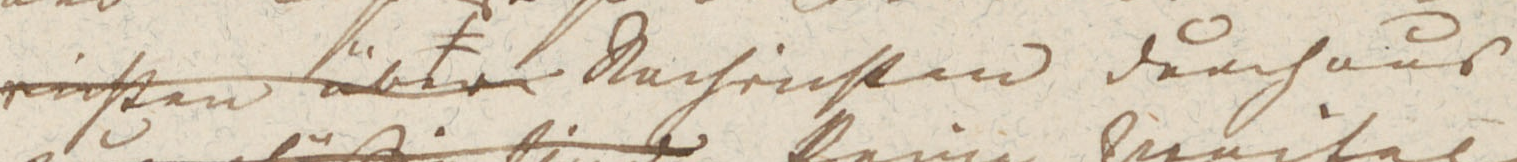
richten über % Nachrichten durchaus
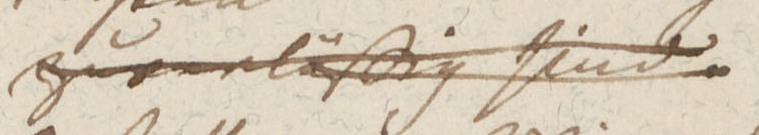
zuverlässig sind keine
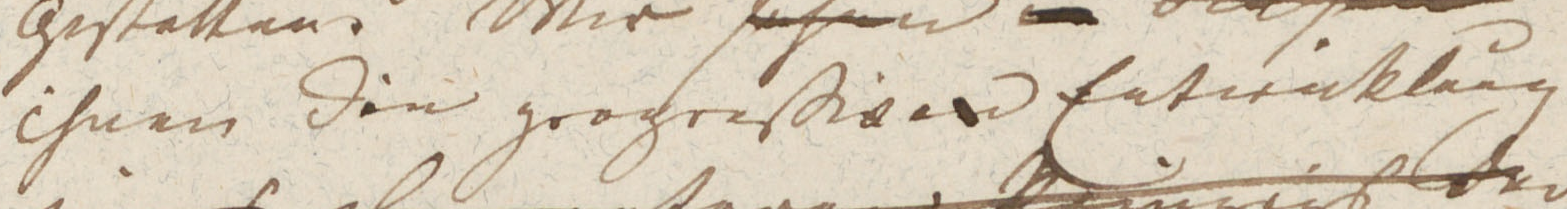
ihnen die progressiven Entwicklung
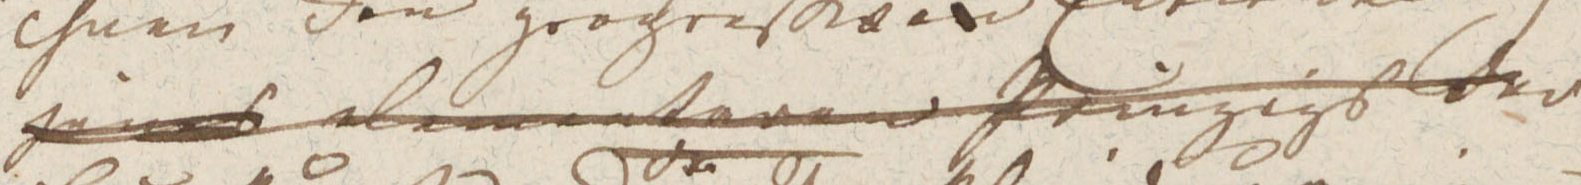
jenes elementaren Prinzips der
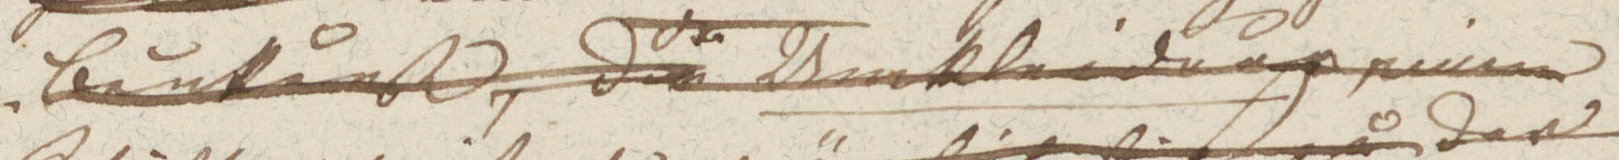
Baukunst, die der Umkleidung einen
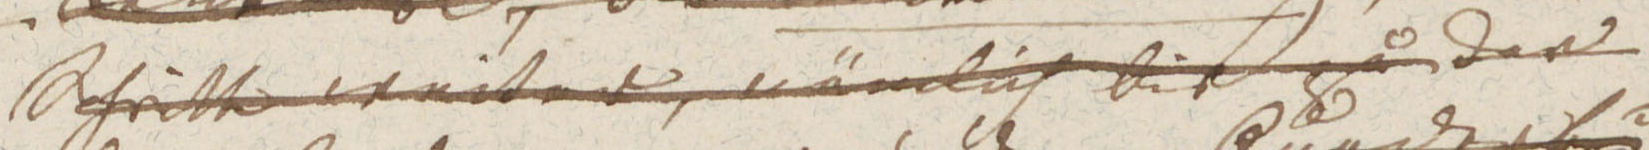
Schritt weiter, nämlich bis zu der
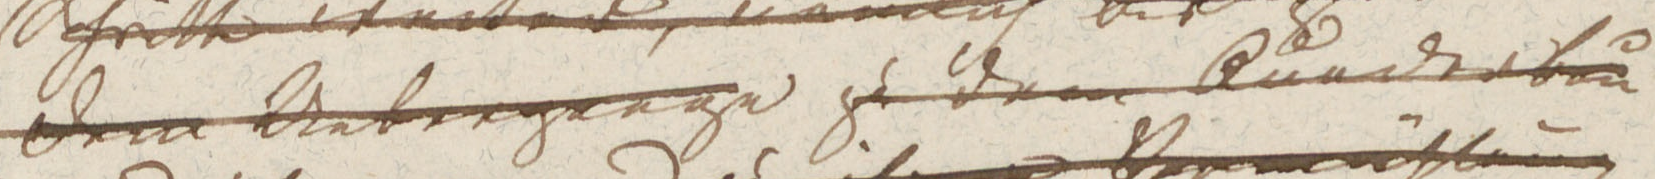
dem Uebergange zu dem Quaderbau
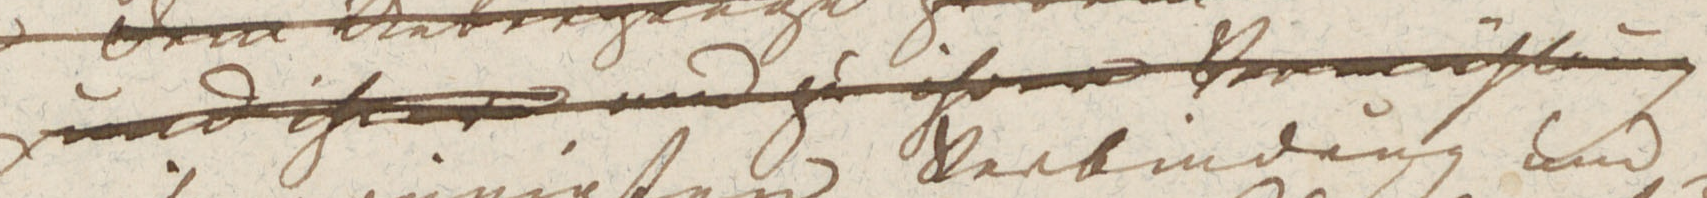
und ihrer und zu ihrer Vermählung
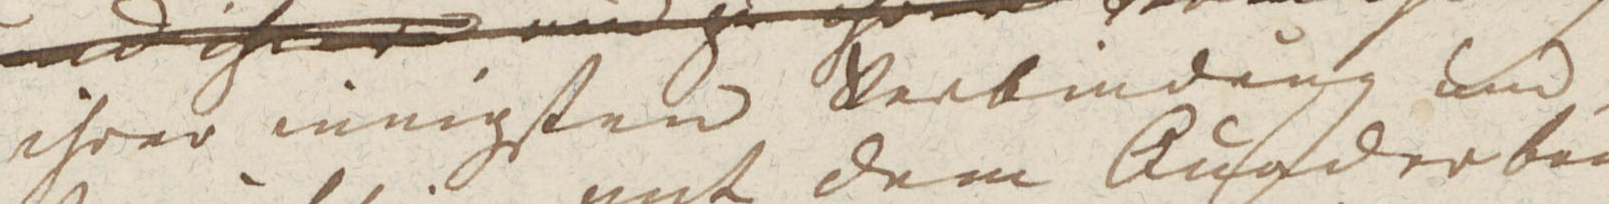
ihrer innigsten Verbindung und
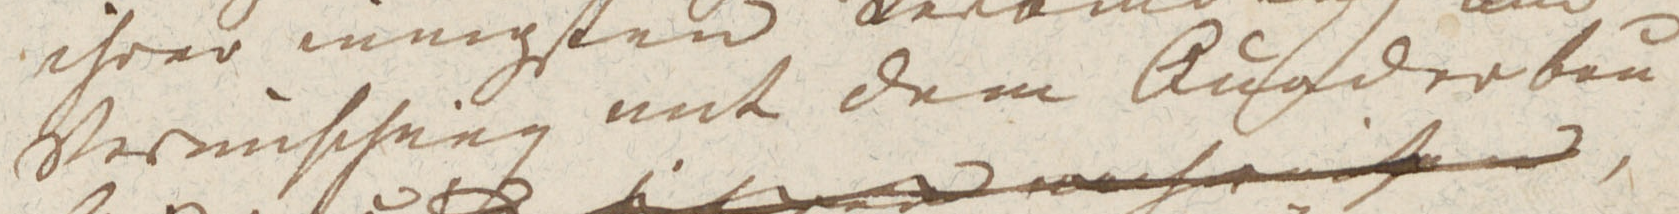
Vermischung mit dem Quaderbau
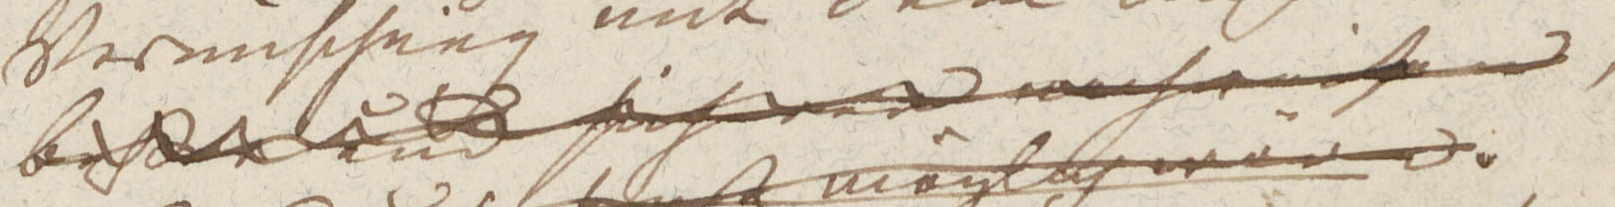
besser und sicherer nachweisen,
